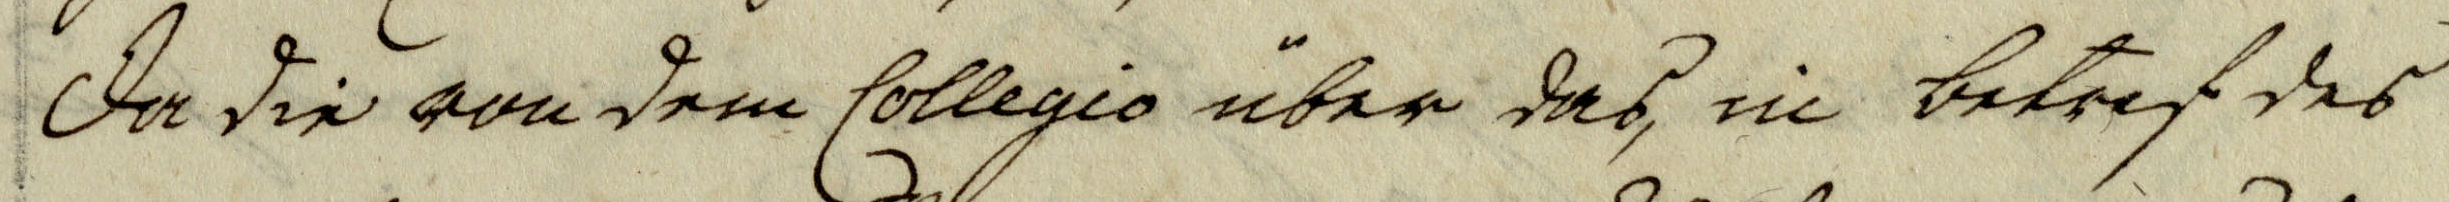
Da die von dem Collegio über das, in Betref des
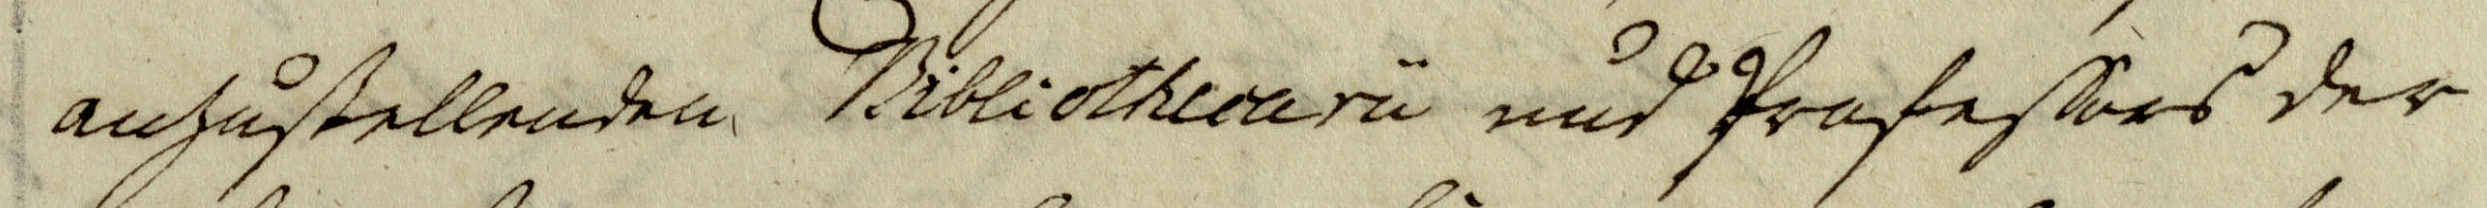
anzustellenden Bibliothecarii und Professors der
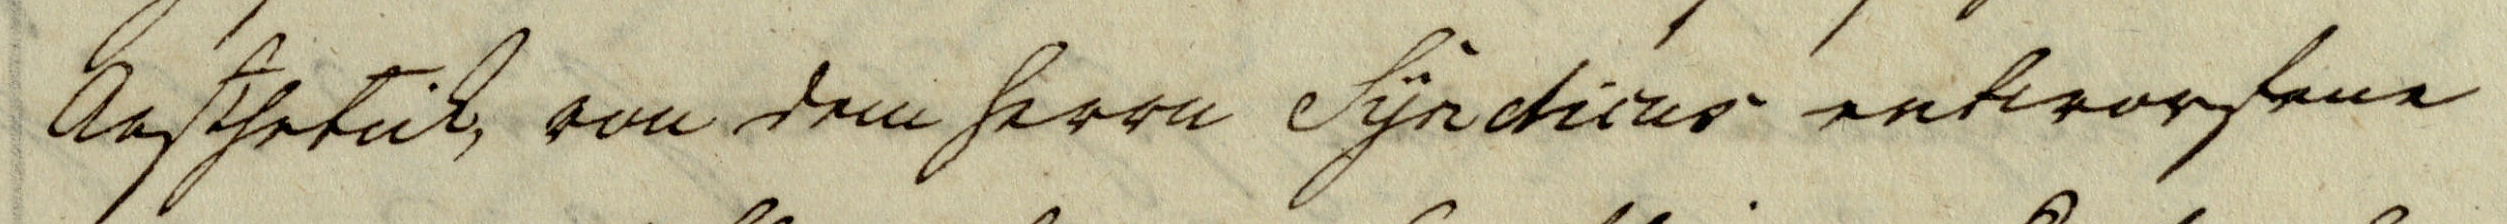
Aesthetick, von dem Herrn Sÿndicus entworfene
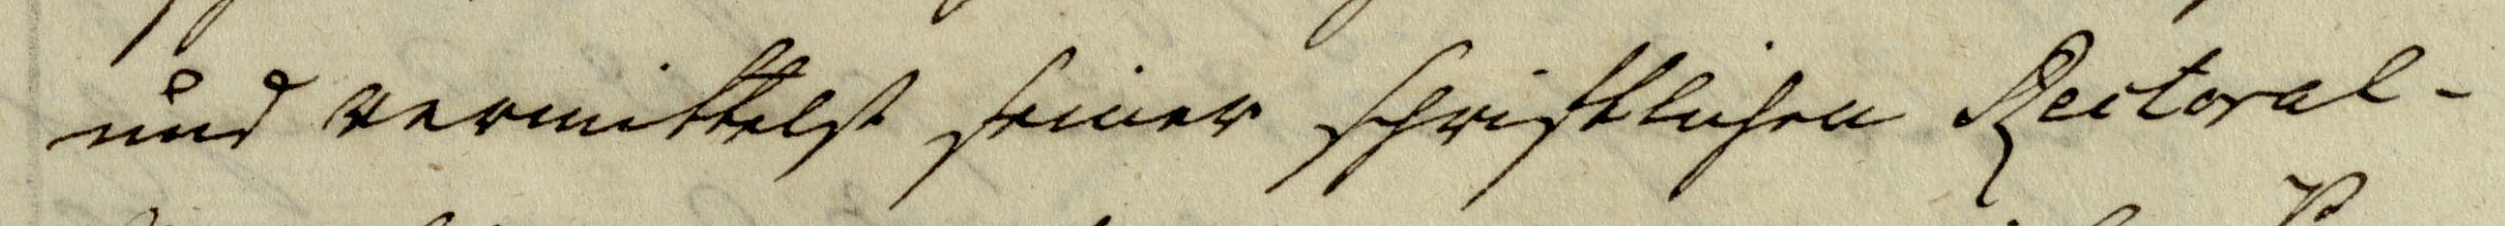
und vermittelst seiner schriftlichen Rectoral¬
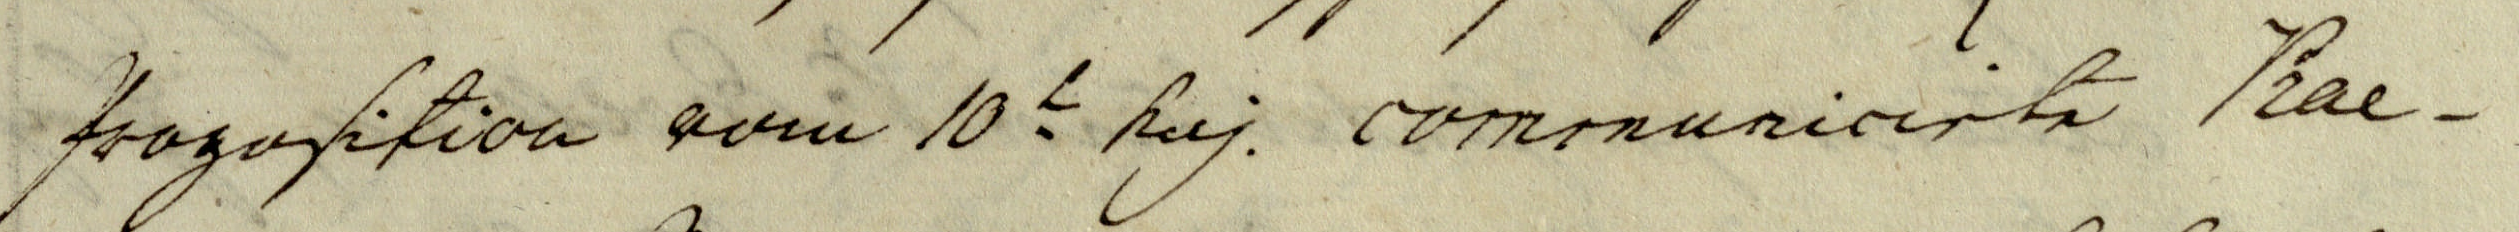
Proposition vom 10t. huj. communicirte Prae¬
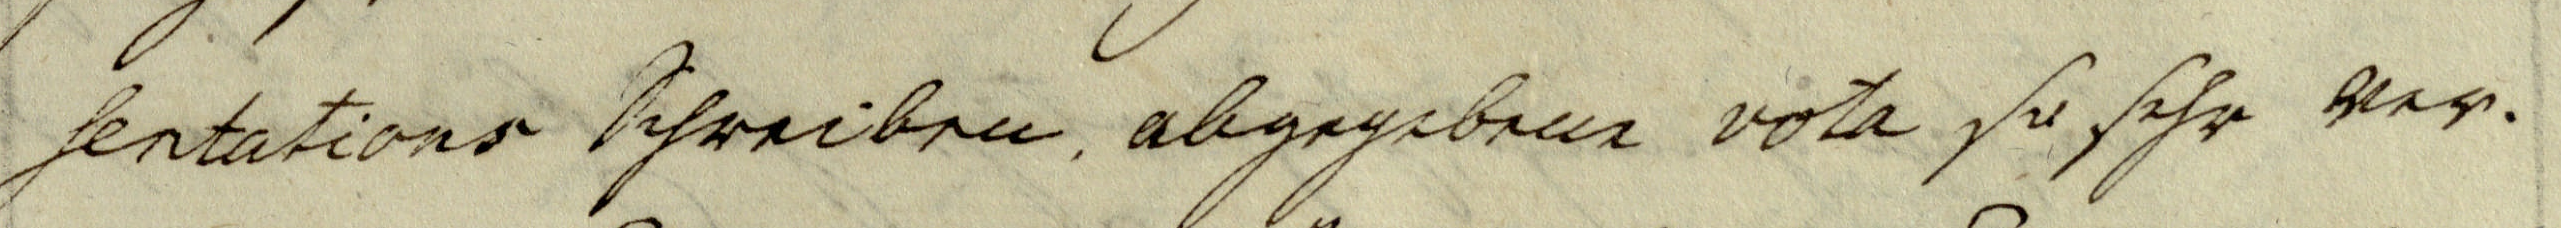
sentations Schreiben abgegebene vota so sehr ver¬
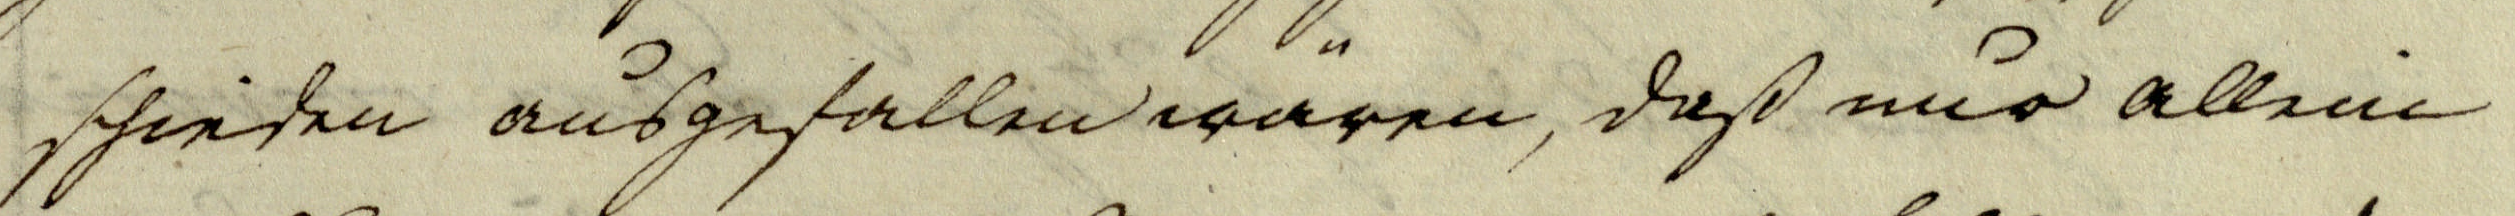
schieden ausgefallen wären, daß nur allein
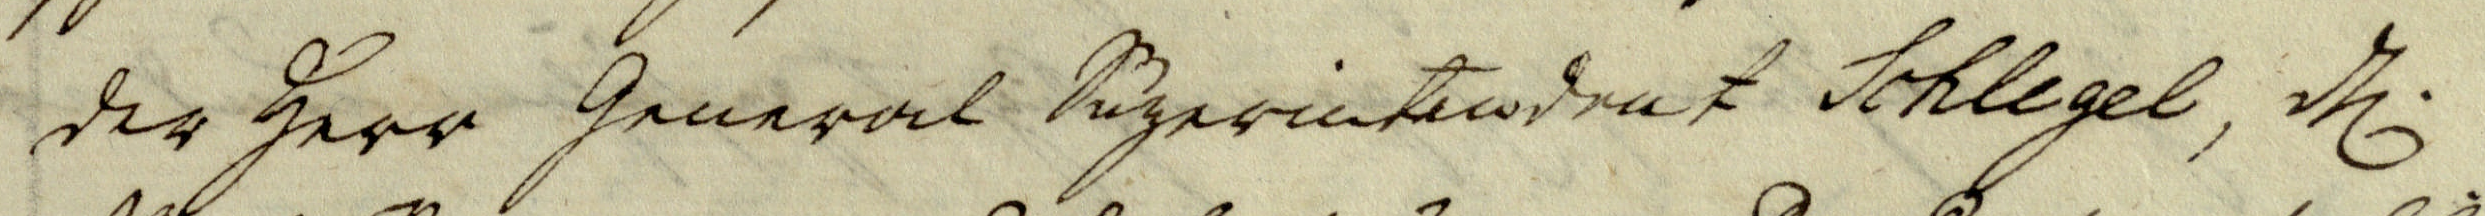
der Herr General Superintendent Schlegel, dh.
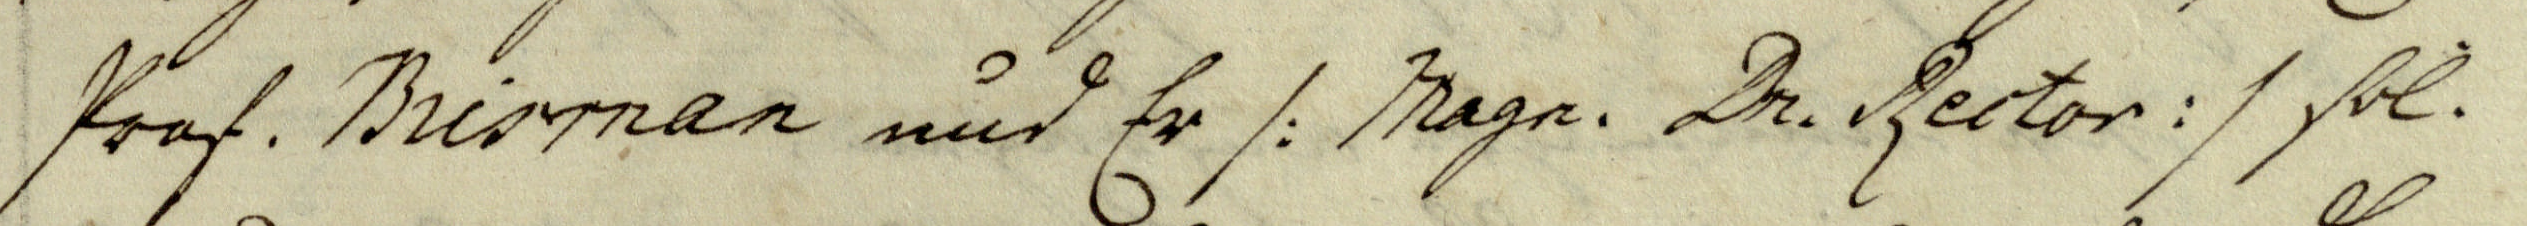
Prof. Brisman und Er /: Magn. Dn. Rector :/ sol¬
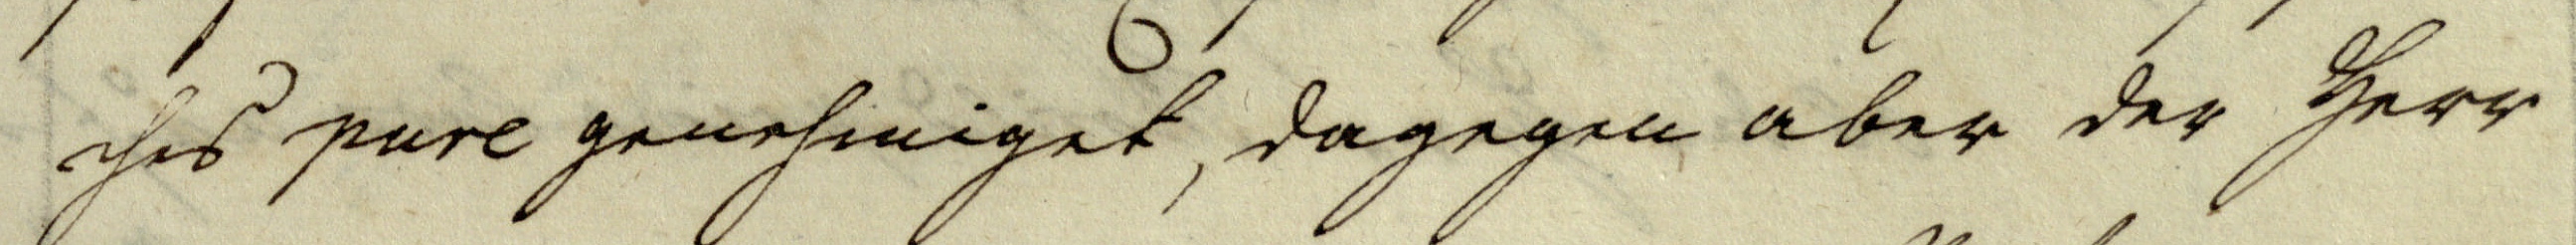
ches pure genehmiget, dagegen aber der Herr
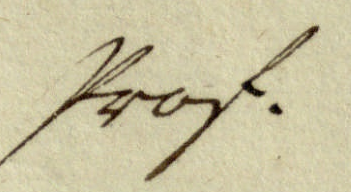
Prof.
